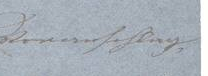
Voranschlag,
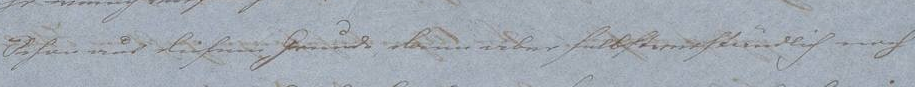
Schon aus diesem Grunde, dann aber selbstverständlich noch
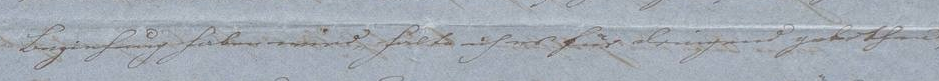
Beziehung haben wird, halte ich es für dringend gebothen,
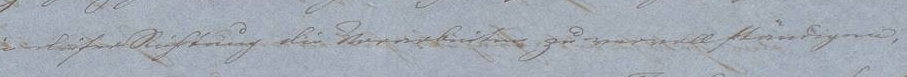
in dieser Richtung die Vorarbeiten zu vervollständigen,
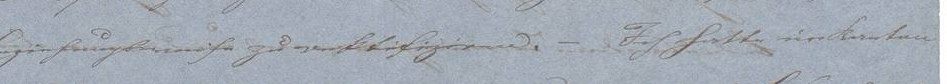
beziehungsweise zu rektifiziren. – Ich hatte in Kanton
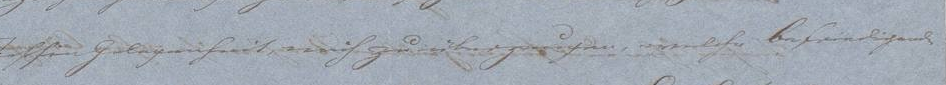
Tessin Gelegenheit, mich zu überzeugen, welche befriedigende
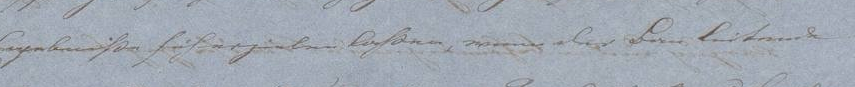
Ergebniße sich erzielen laßen, wenn der Bau leitende
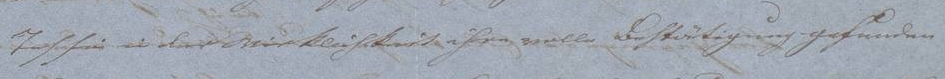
Tessin in der Wirklichkeit ihre volle Bestätigung gefunden
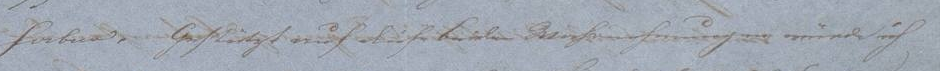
haben. Gestützt auf diese beiden Wahrnehmungen würde ich
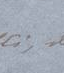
den Herrn
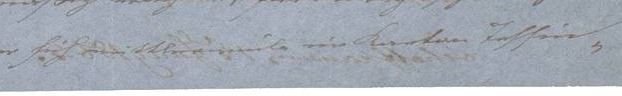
Wetli, der sich mittlerweile
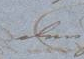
in Kanton
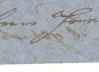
Tessin
